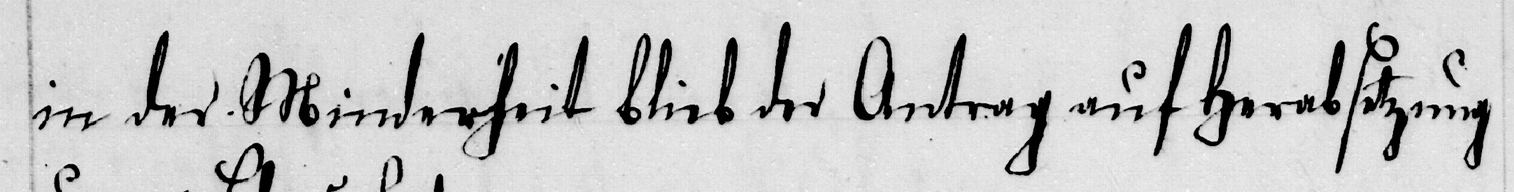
in der Minderheit blieb der Antrag auf Herabsetzung
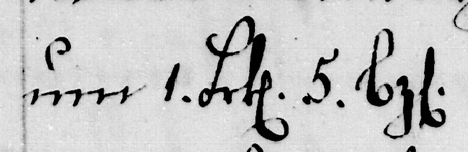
um 1. Frk[en]. 5.
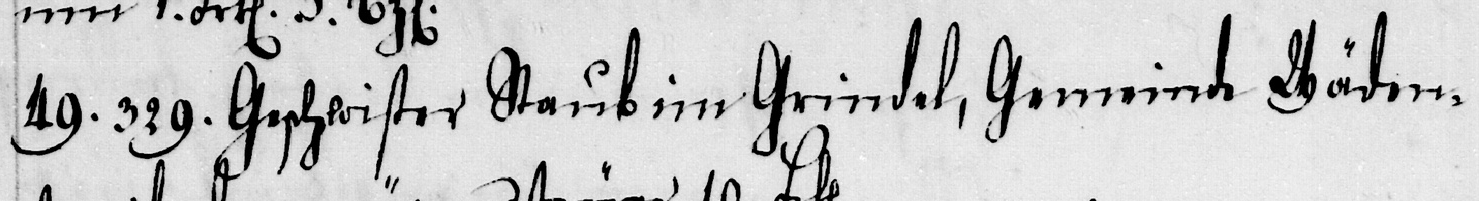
49. 329. Geschwister Staub im Grindel, Gemeinde Wäden¬
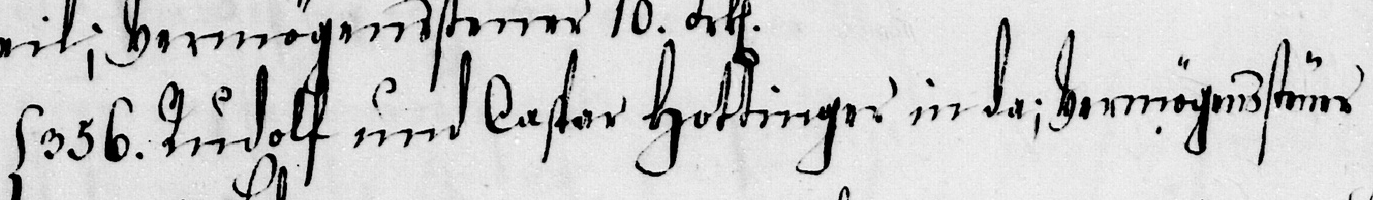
356. Rudolf und Caspar Hottinger in da; Vermögenssteuer
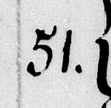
8.
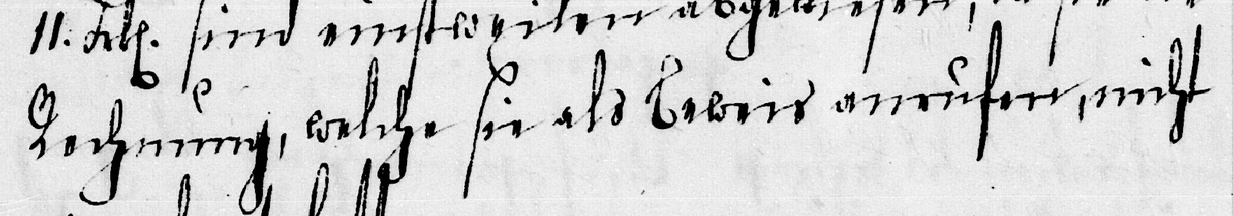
Rechnung, welche sie als Beweis anrufen, nicht
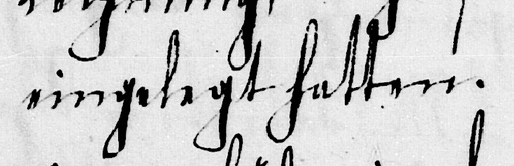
eingelegt hatten.
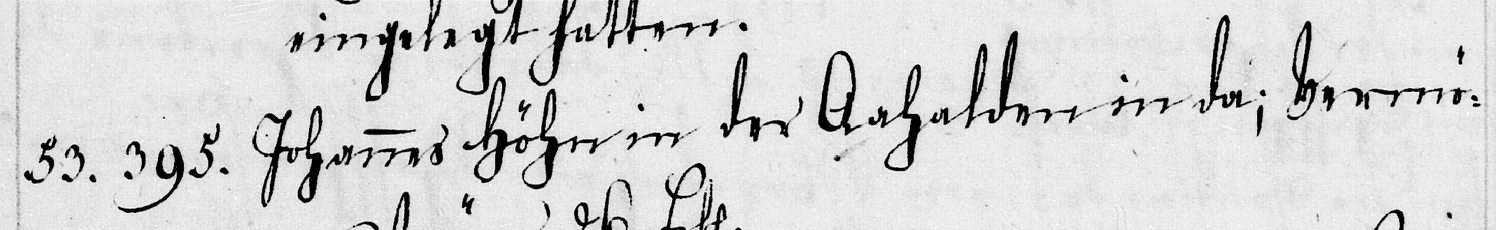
53. 395. Johannes Höhn in der Aahalden in da; Vermö¬
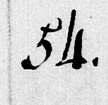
54.
